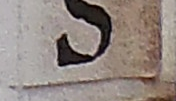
S
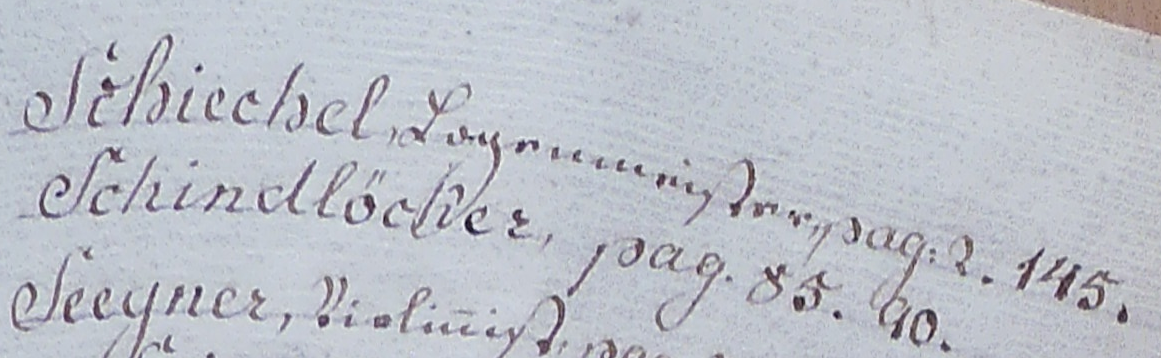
Schiechel, Logenmeister, pag: 2. 145.
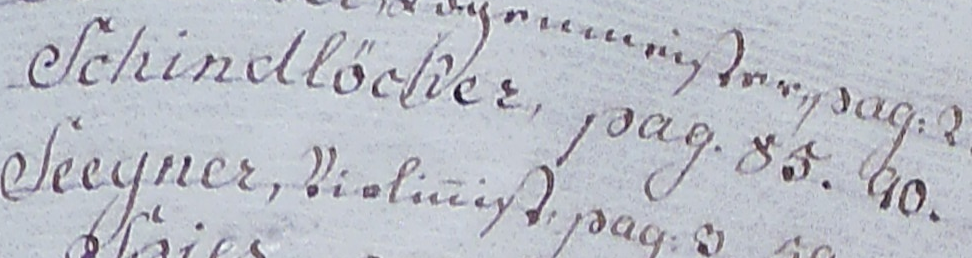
Schindlöcker, pag. 85. 90.
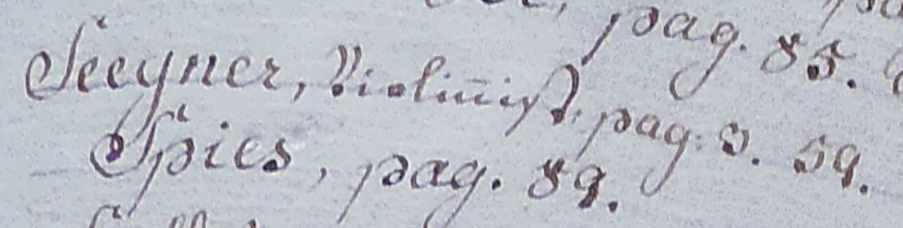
Seegner, Violin̅ist, pag. 3. 59.
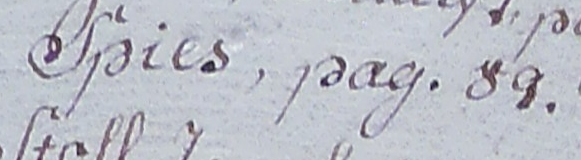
Spies, pag. 89.
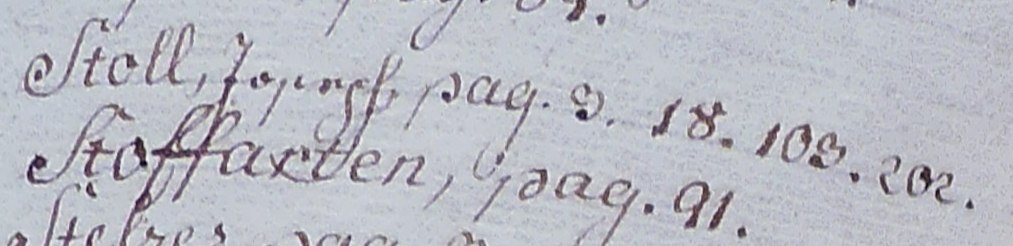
Stoll, Joseph, pag. 3. 18. 103. 202.
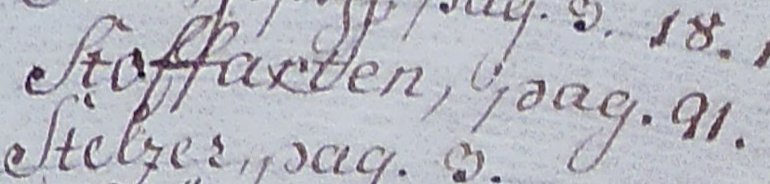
Stoffarten, pag. 91.
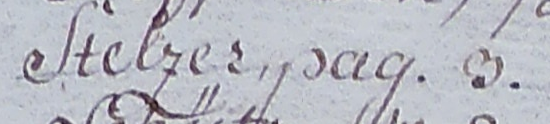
Stelzer, pag. 3.
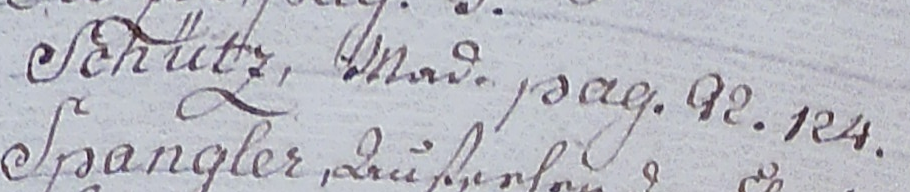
Schütz, Mad. pag. 92. 124.
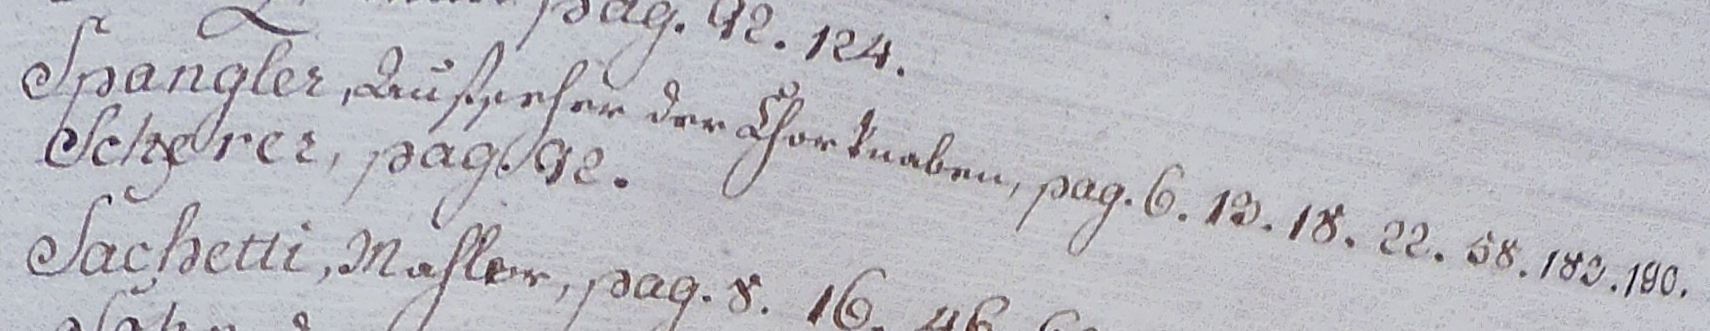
Spangler, Aufseher der Chorknaben, pag. 6. 13. 18. 22. 58. 183. 190.
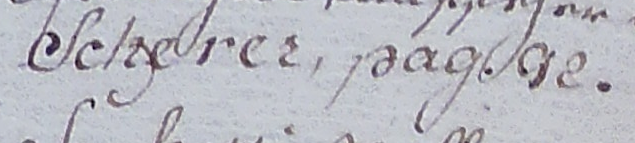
Scherer, pag. 92.
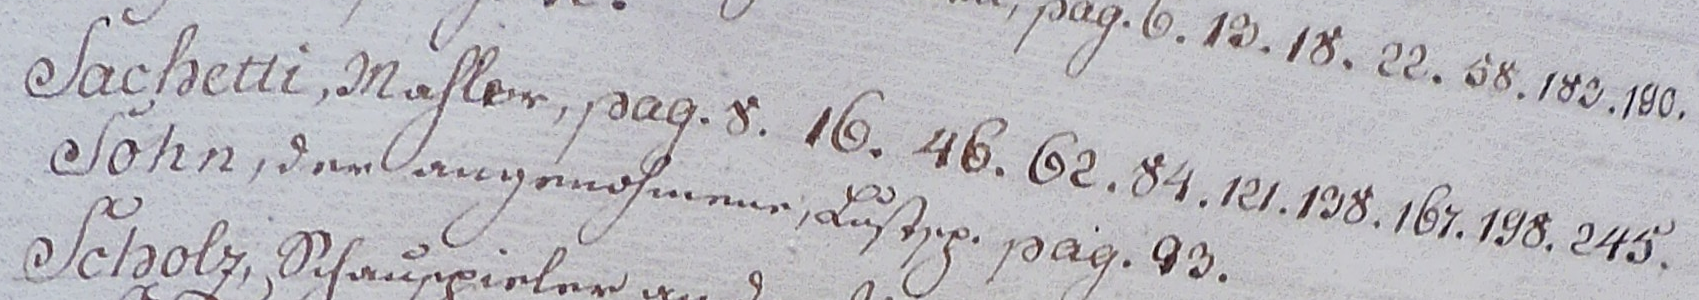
Sachetti, Mahler, pag. 8. 16. 46. 62. 84. 121. 138. 167. 198. 245.
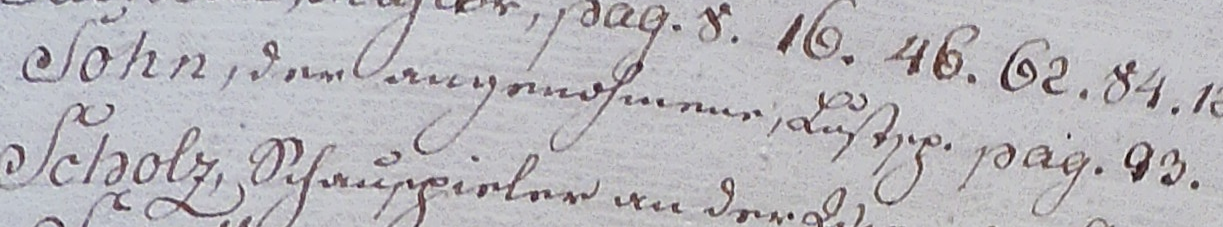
Sohn, der angenohmene, Lustsp. pag. 93.
